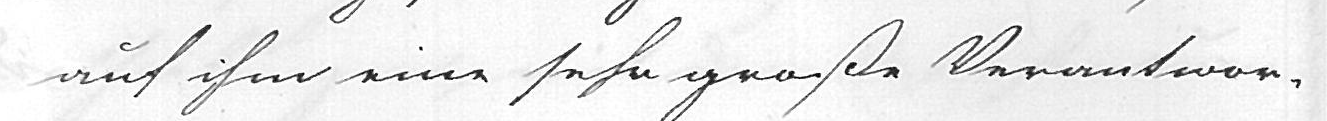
auf ihm eine sehr große Verantwor-
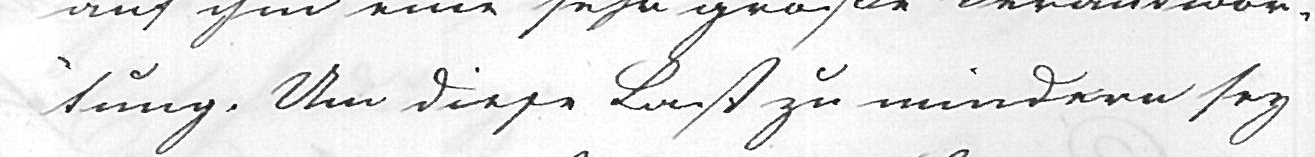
tung. Um diese Last zu mindern sey
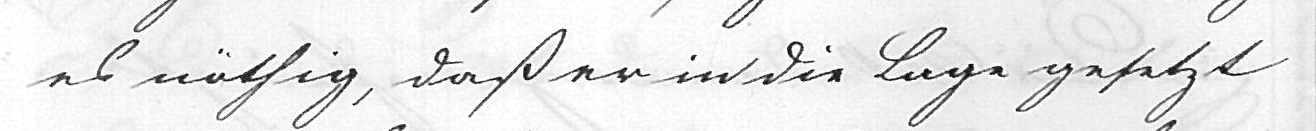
es nöthig, daß er in die Lage gesetzt
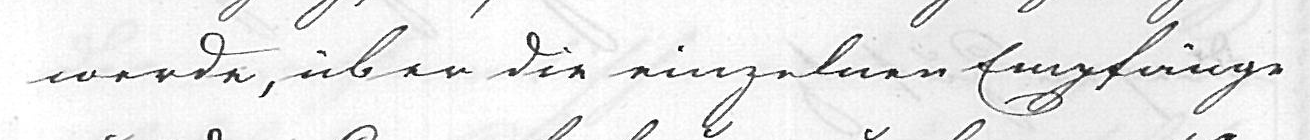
werde, über die einzelnen Empfänge
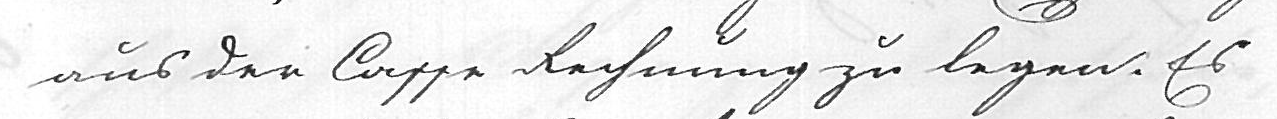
aus der Casse Rechnung zu legen. Es
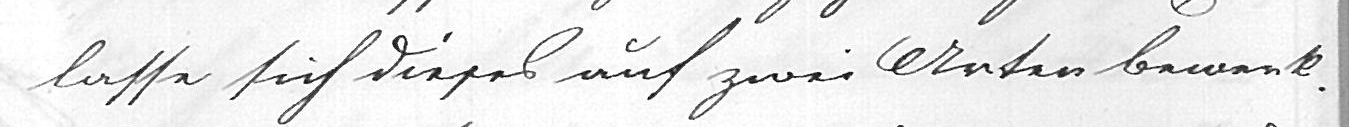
lasse sich dieses auf zwei Arten bewerk-
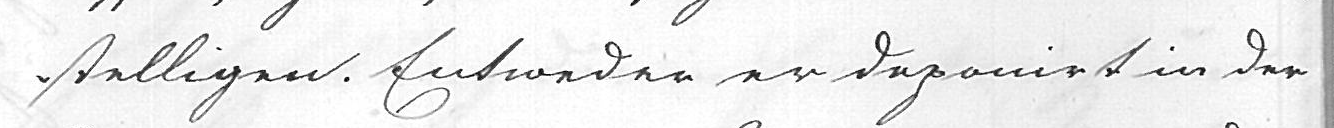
stelligen. Entweder er deponirt in der
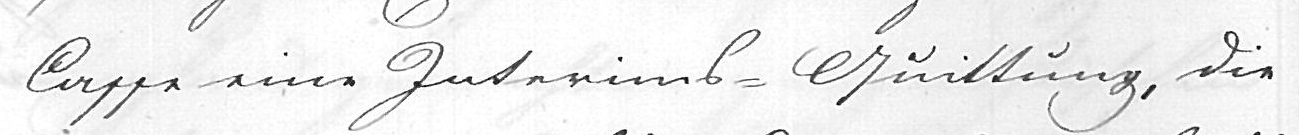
Casse eine Interims-Quittung, die
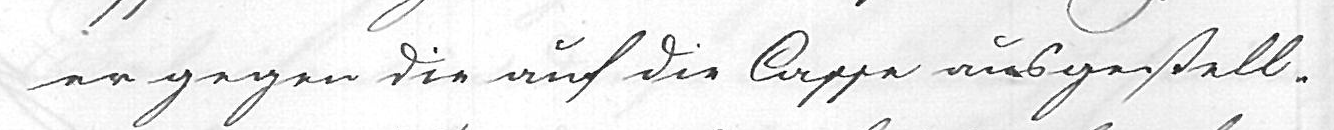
er gegen die auf die Casse ausgestell-
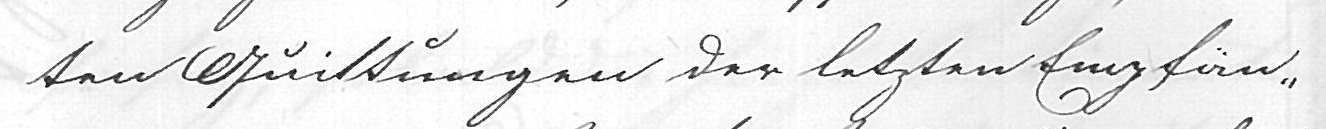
ten Quittungen der letzten Empfän-
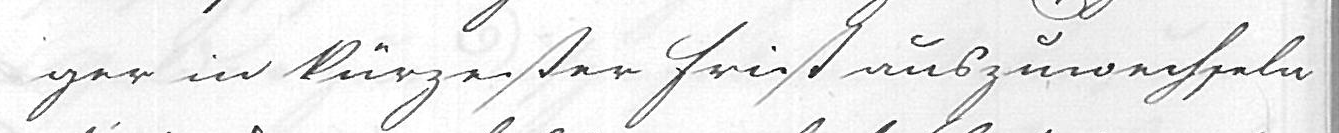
ger in kürzester Frist auszuwechseln
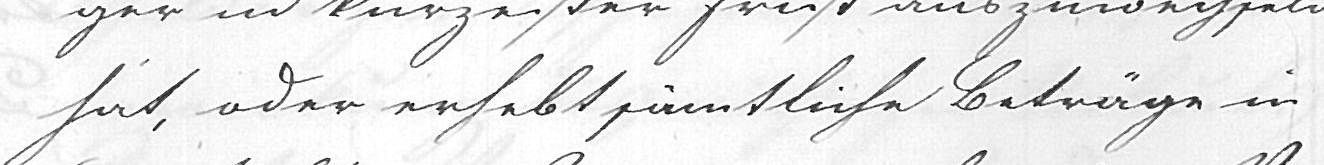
hat, oder erhebt sämtliche Beträge in
